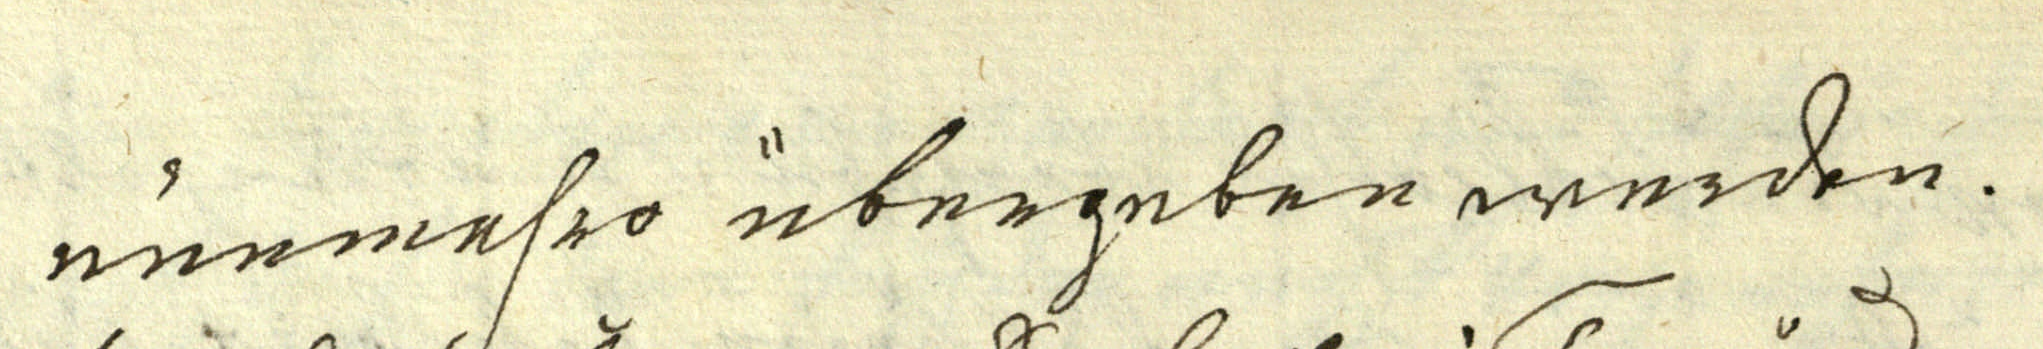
nunmehro übergeben werden.
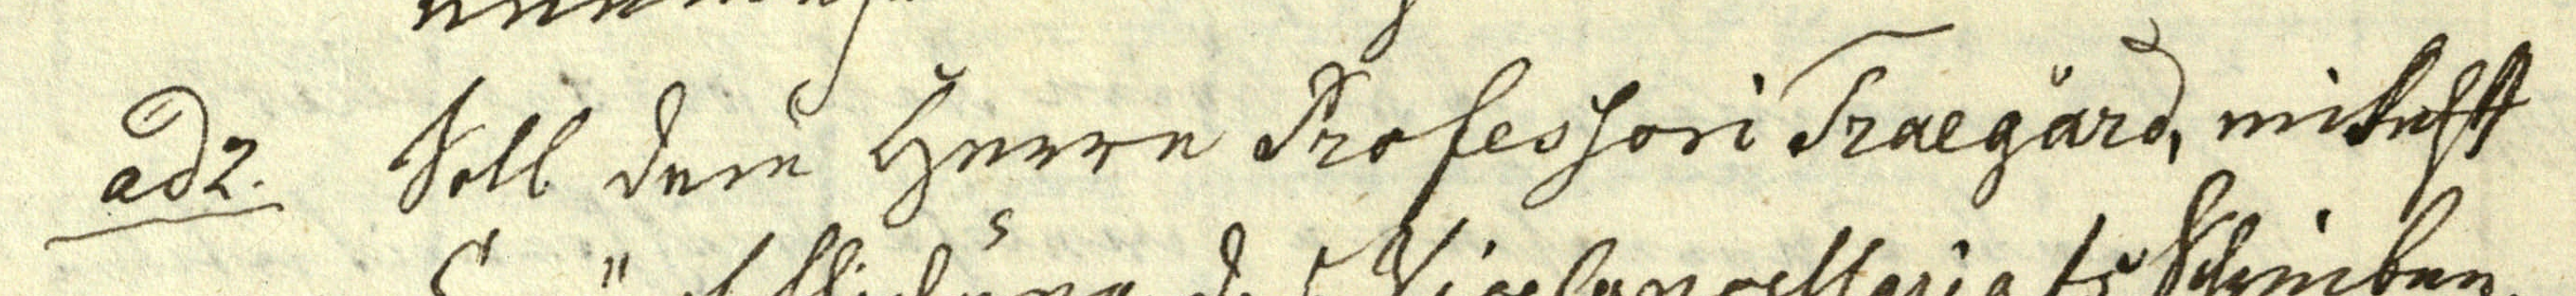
ad 2. Soll dem Herrn Professori Traegård, mittelst
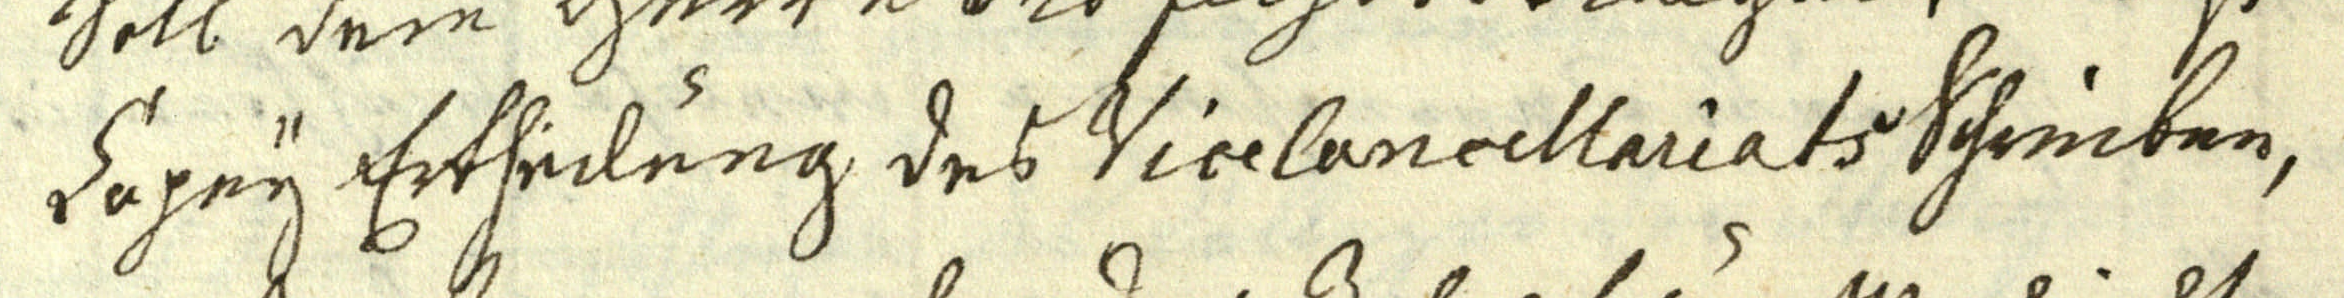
Copeÿ Ertheilung des ViceCancellariats Schreiben,
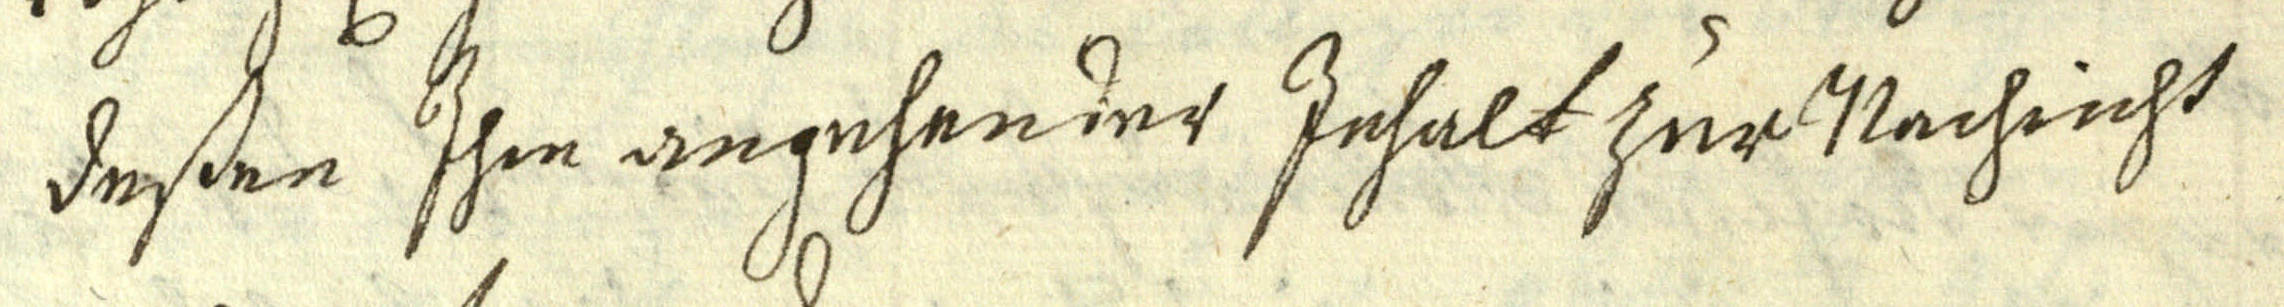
deßen Ihm angehender Inhalt zur Nachricht
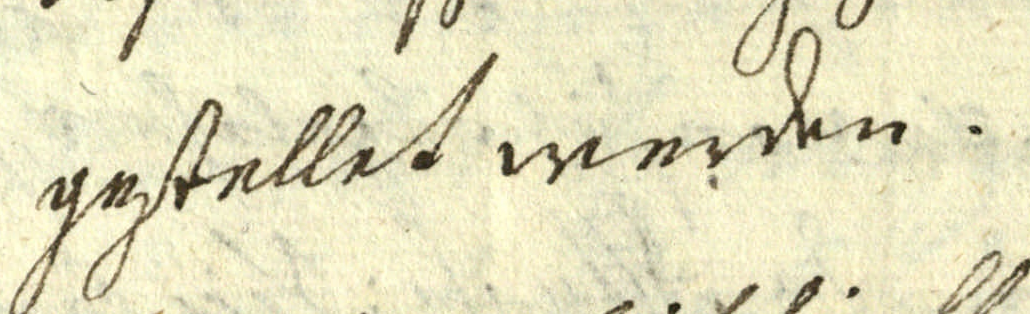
gestellet werden.
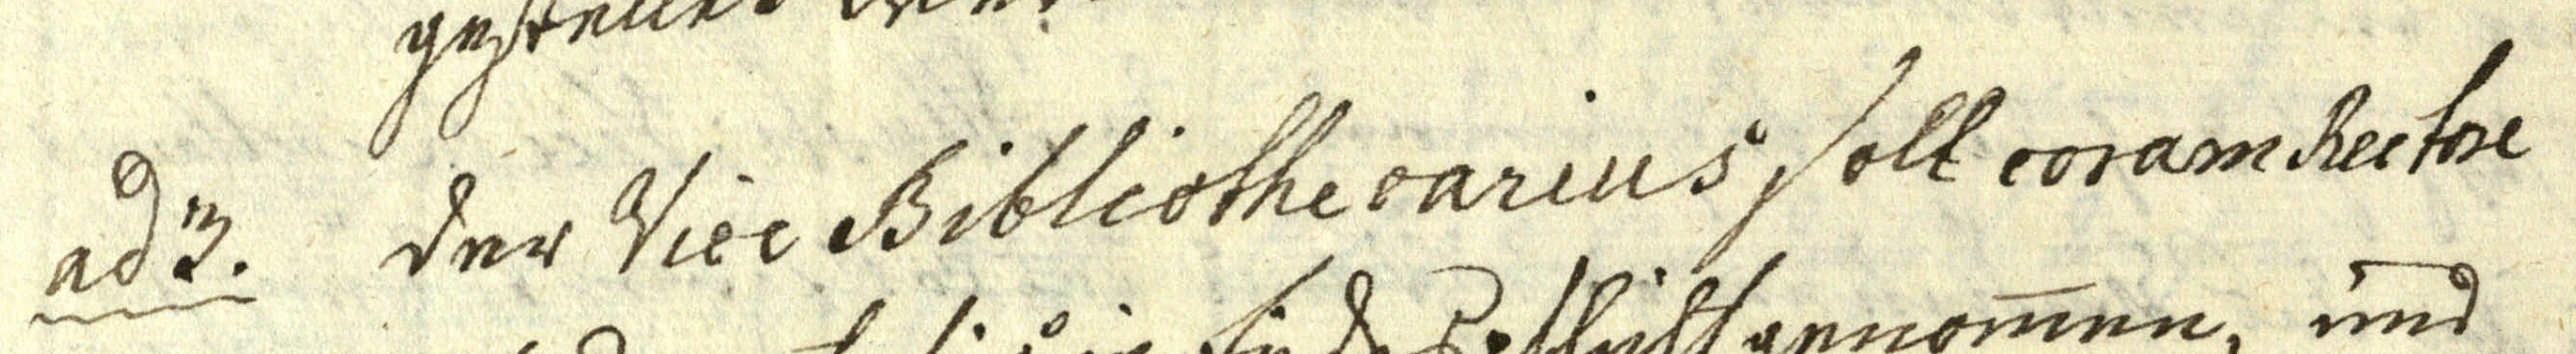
ad 3. der Vice Bibliothecarius soll coram Rectore
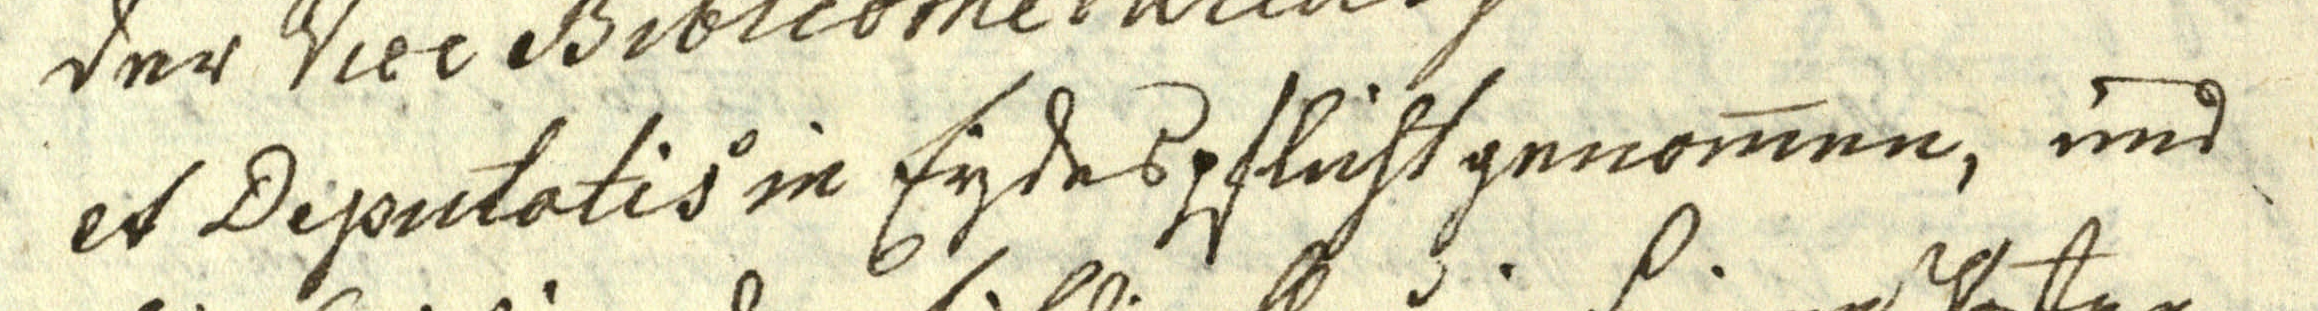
et Deputatis in Eÿdespflicht genomen, und
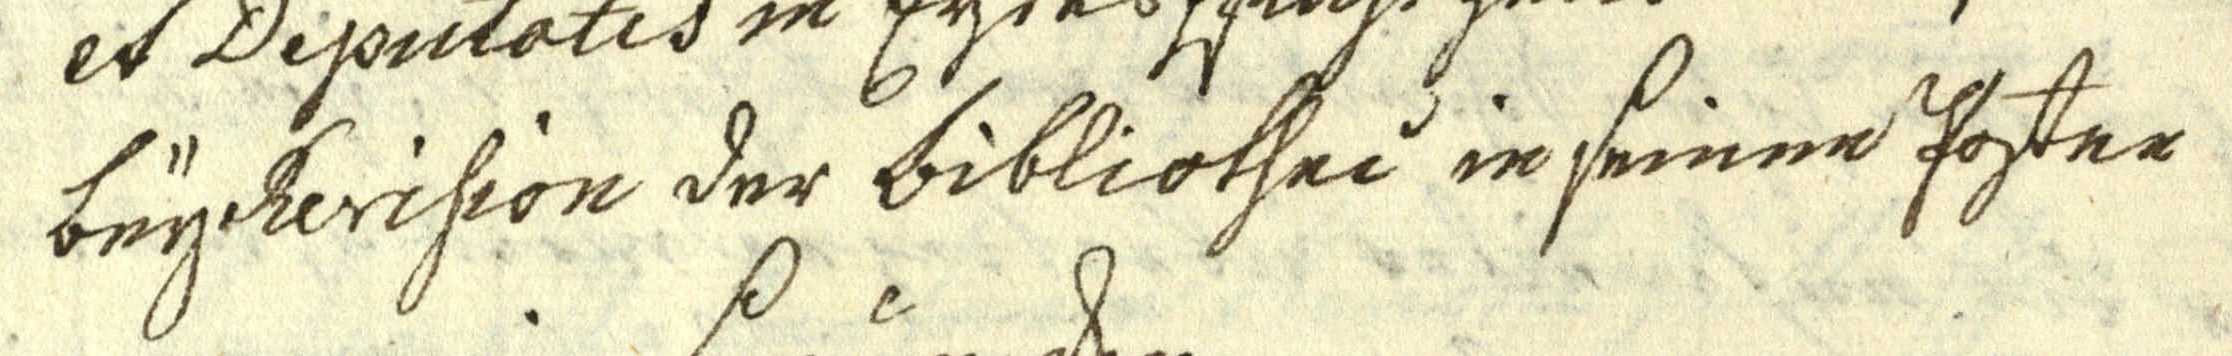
beÿ Revision der Bibliothec in seinen Posten
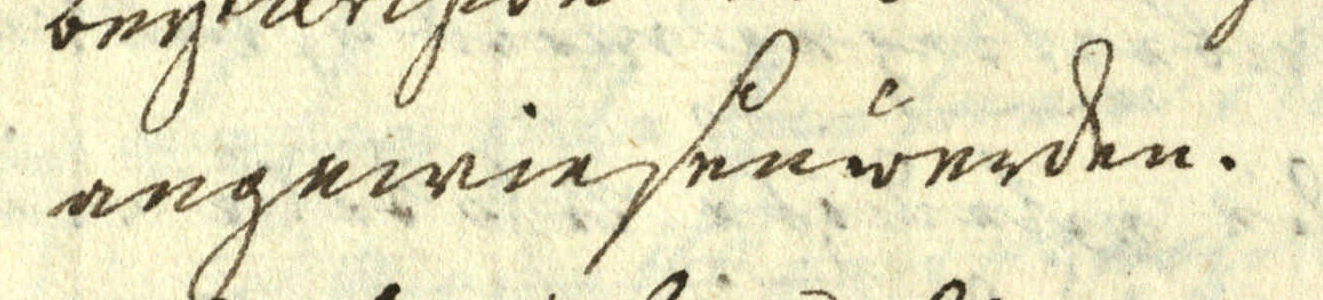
angewiesenwerden.
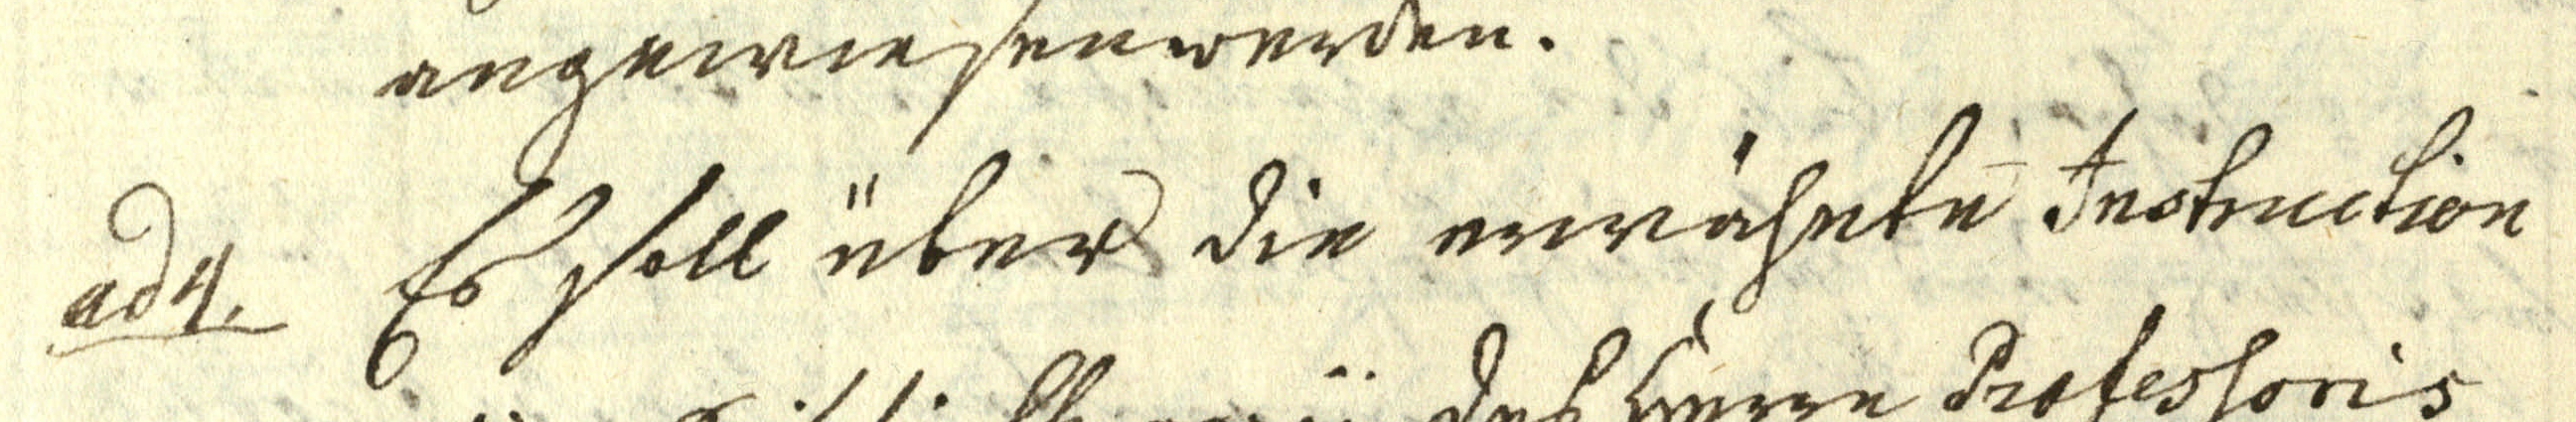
ad 4. Er soll über die erwähnte Instruction
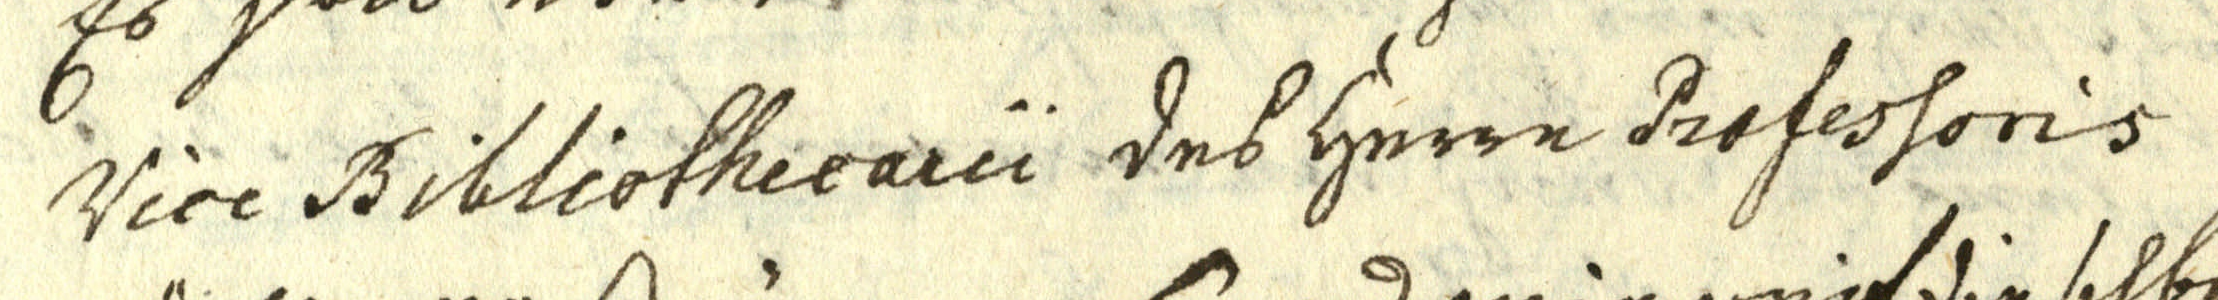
Vice Bibliothecarii des Herrn Professoris
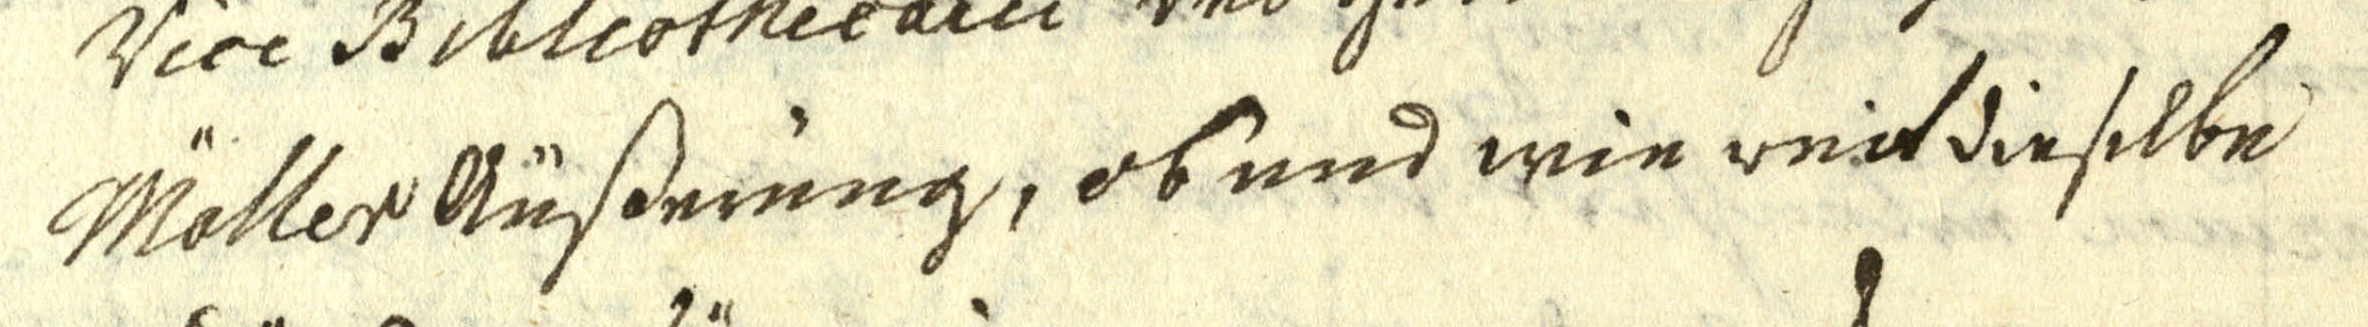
Möller Äußerung, ob und wie weit dieselbe
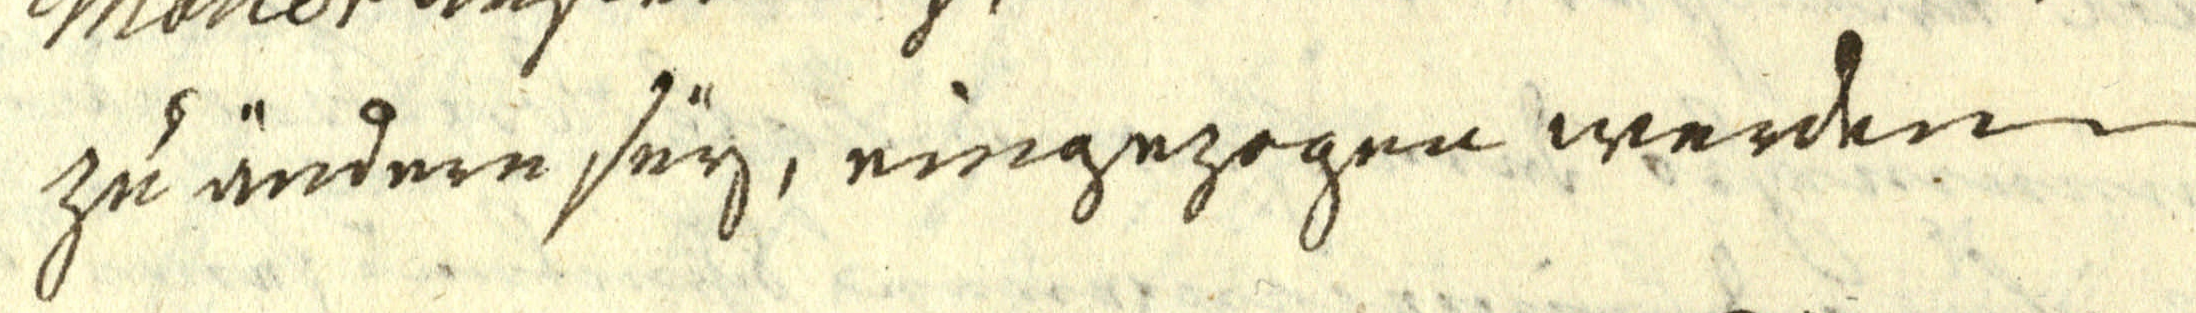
zu ändern seÿ, eingezogen werden.
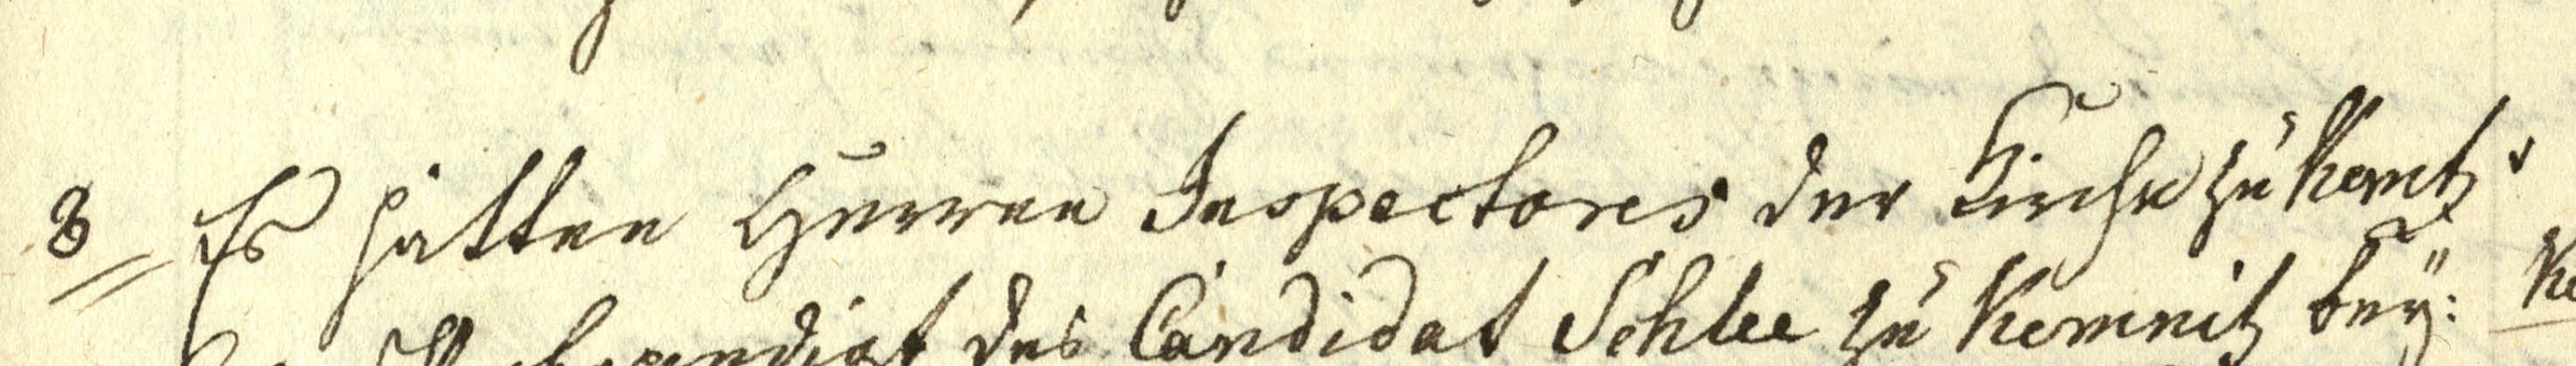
8. Es hätten Herren Inspectores der Kirche zu Kemtz
